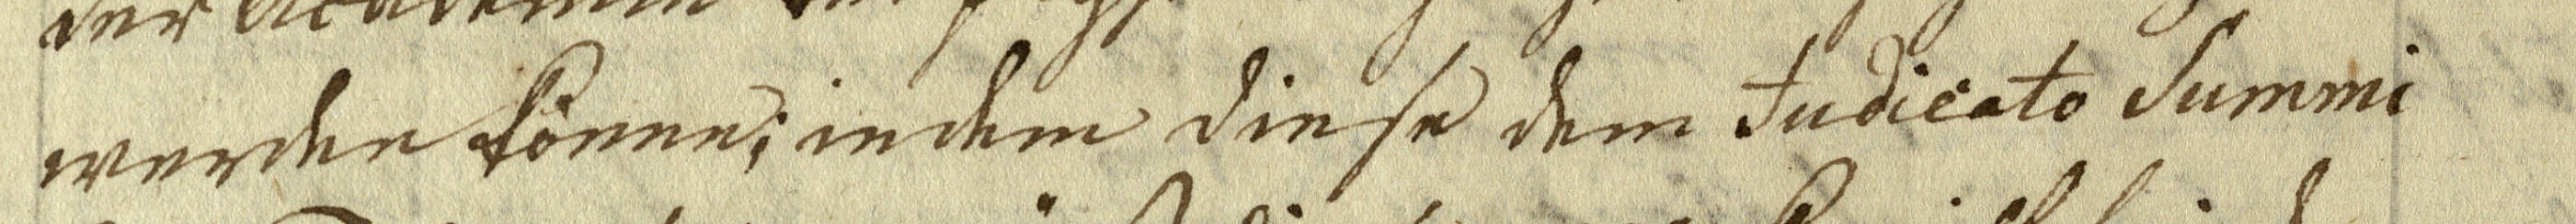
werden könne; indem diese dem Judicato Summi
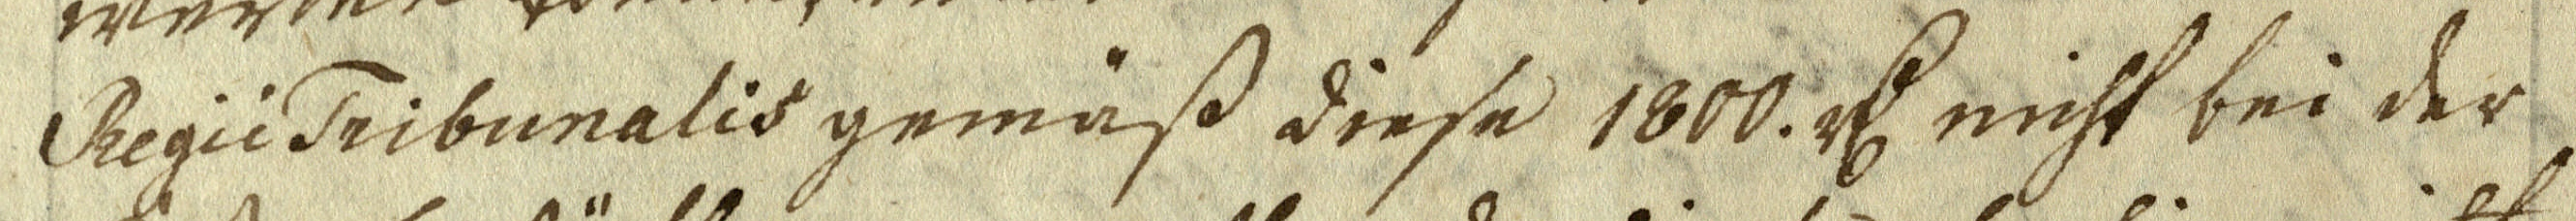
Regii Tribunalis gemäß diese 1800. r. nicht bei der
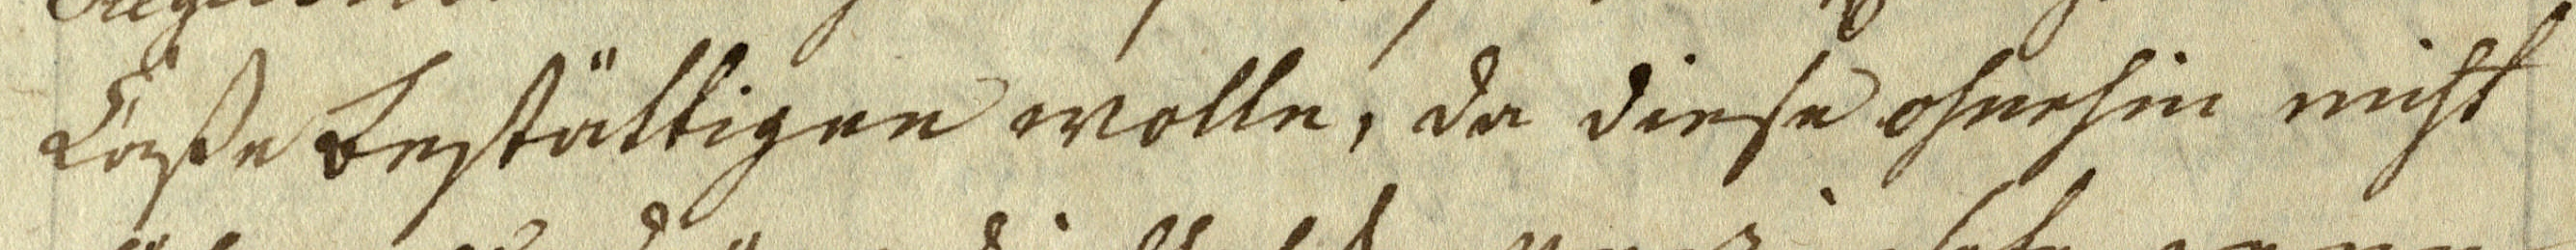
Caße bestättigen wolle, da diese ohnehin nicht
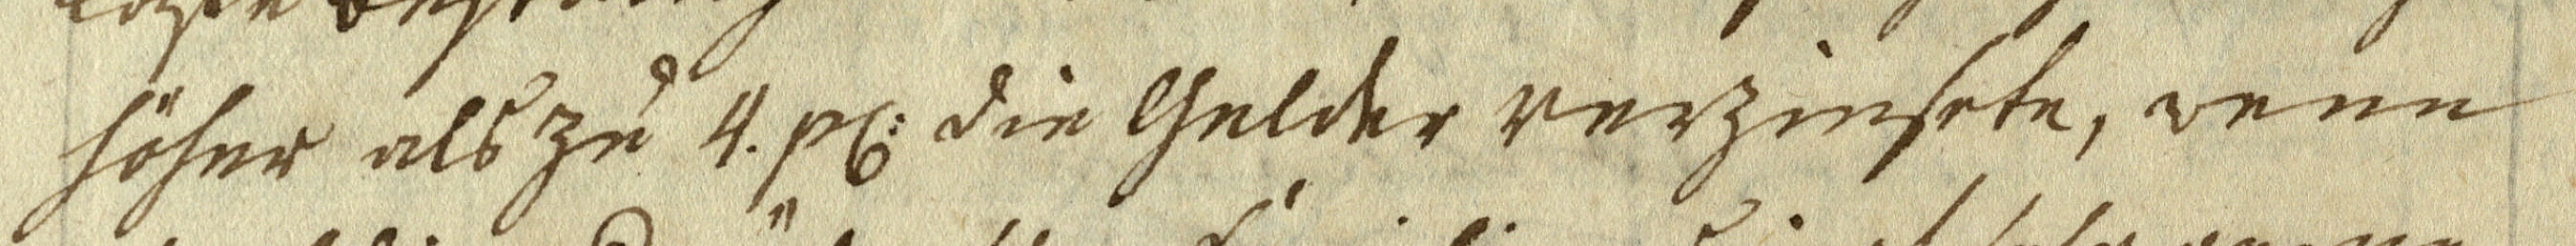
höher als zu 4. p: die Gelder verzinsete, wenn
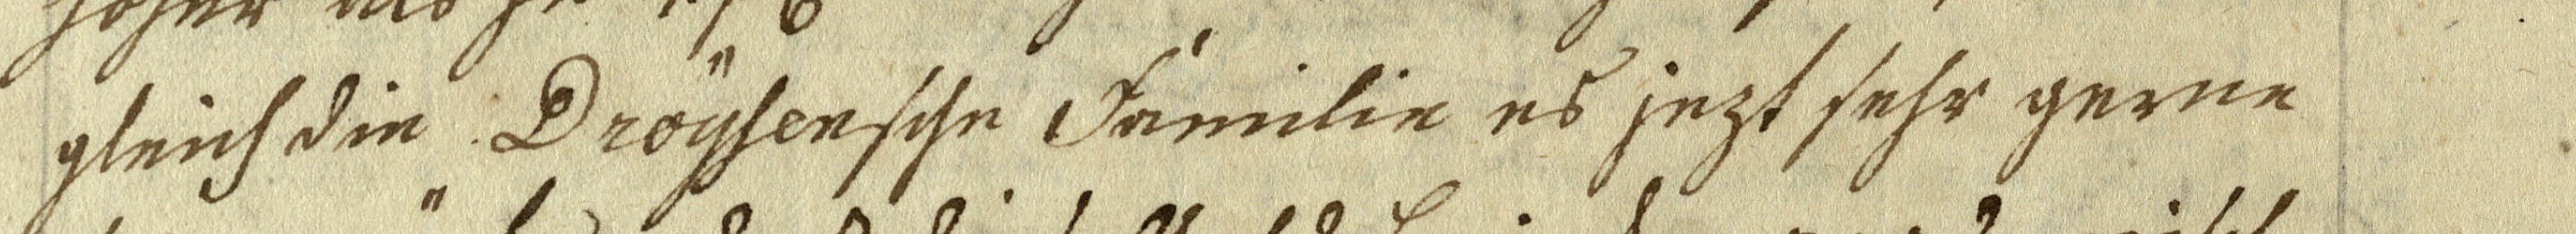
gleich die Droÿsensche Familie es jezt sehr gerne
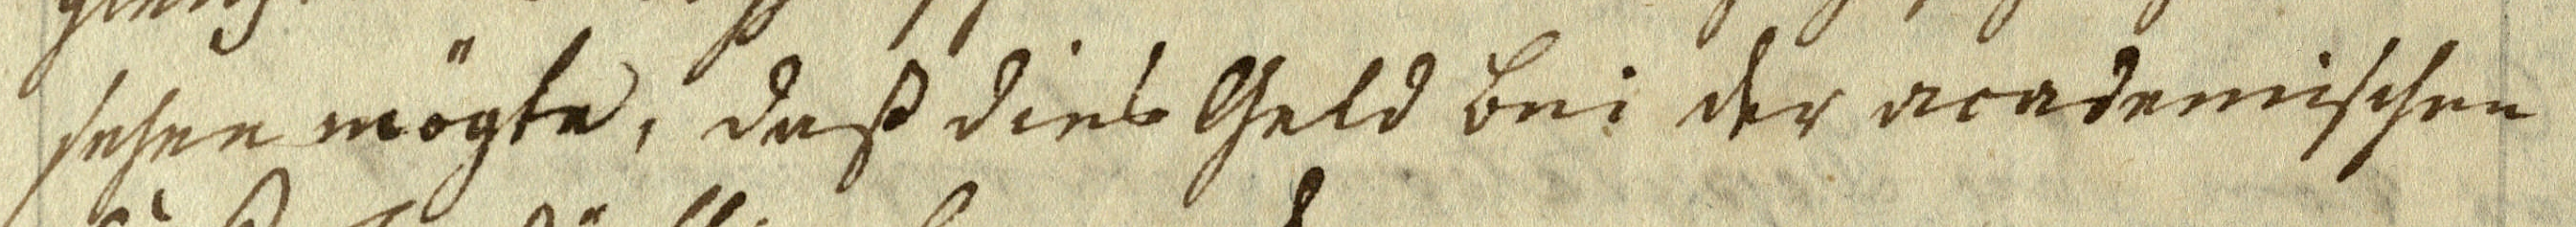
sehen mögte, daß dies Geld bei der academischen
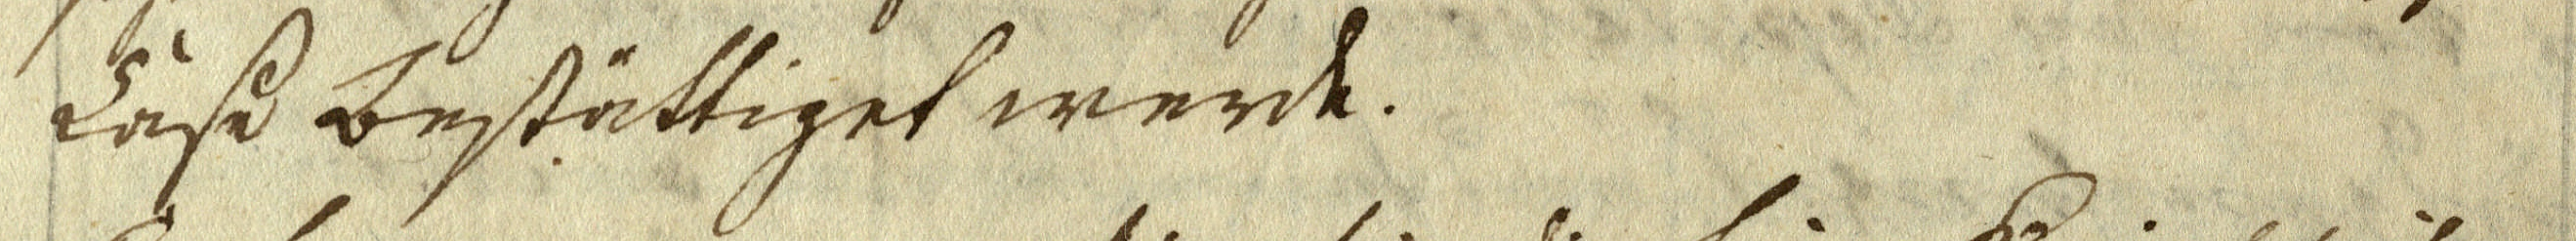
Caße bestättiget werde.
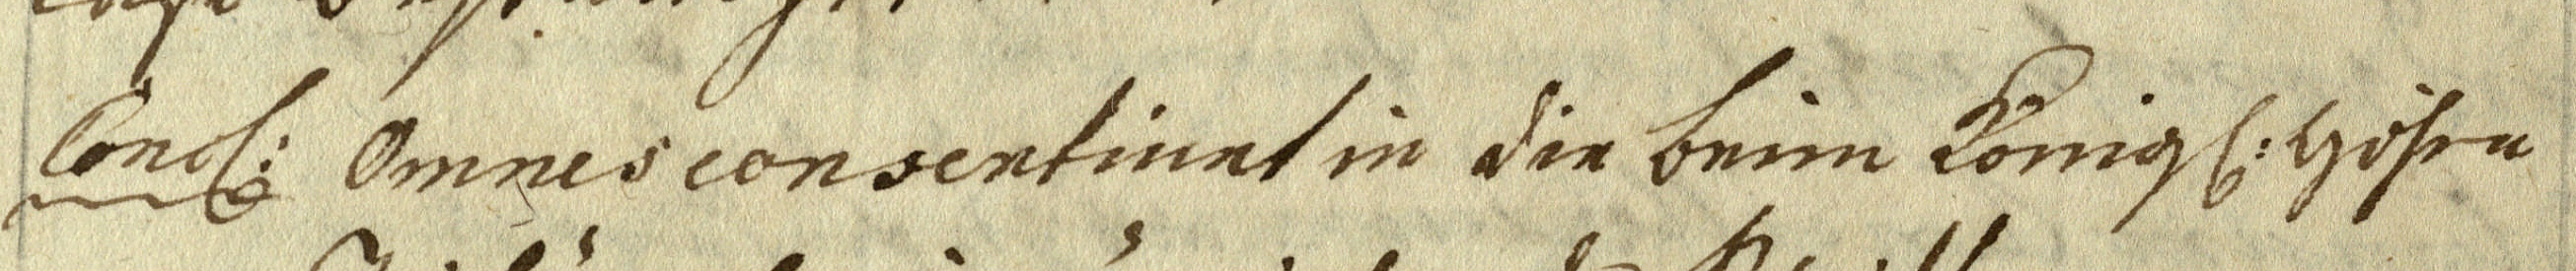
Concl: Omnes consentiunt in die beim Königl: Hohen
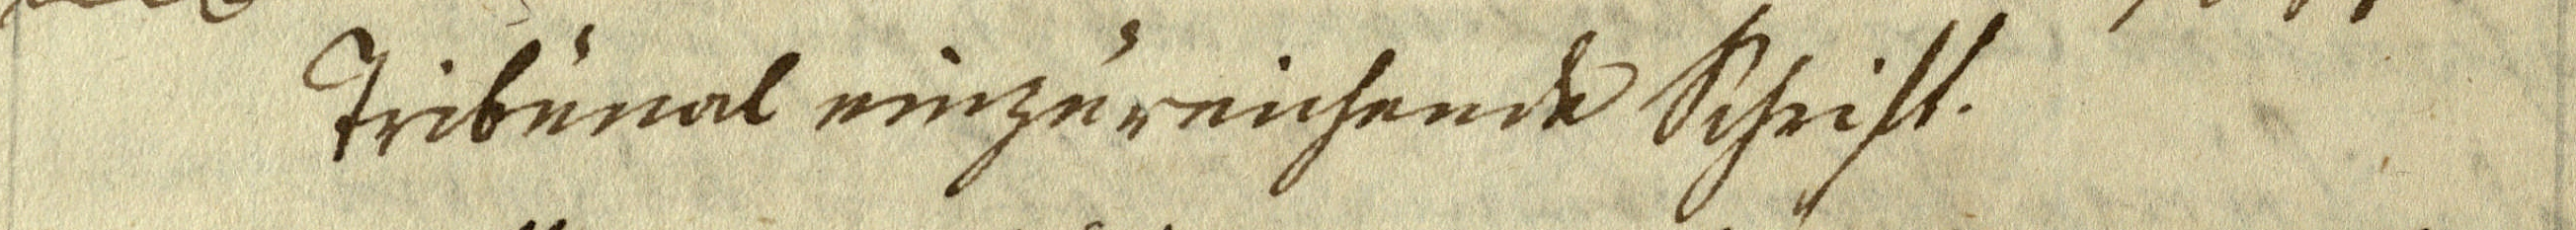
Tribunal einzureichende Schrift.
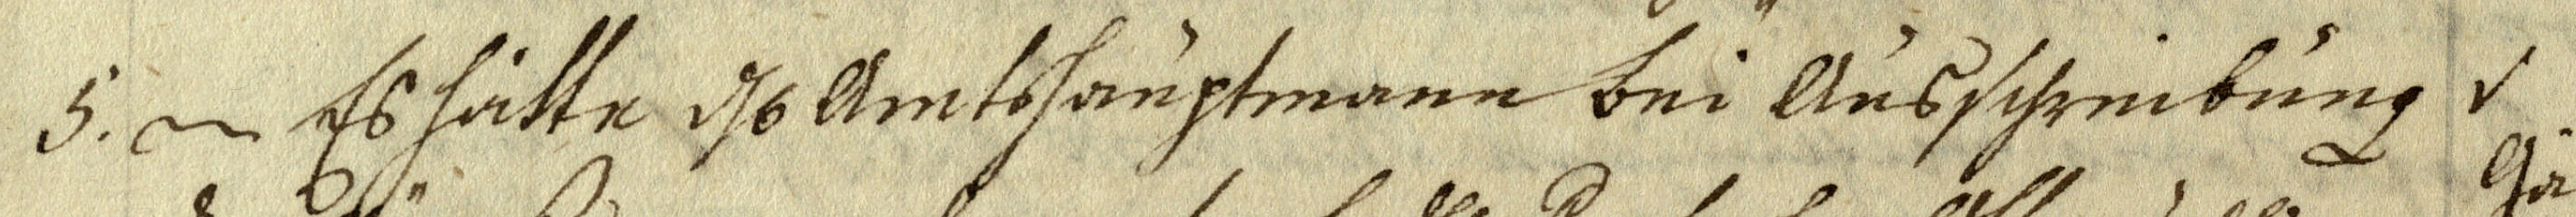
5. Es hätte dh Amtshauptmann bei Ausschreibung
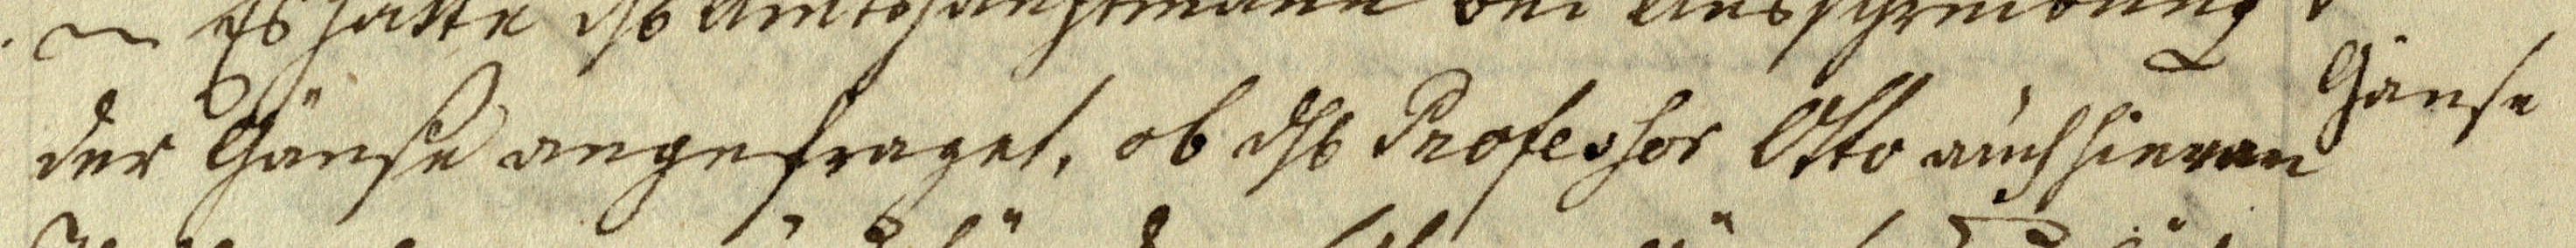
der Gänse angefraget, ob dh Profesor Otto auch hieran Gänse
